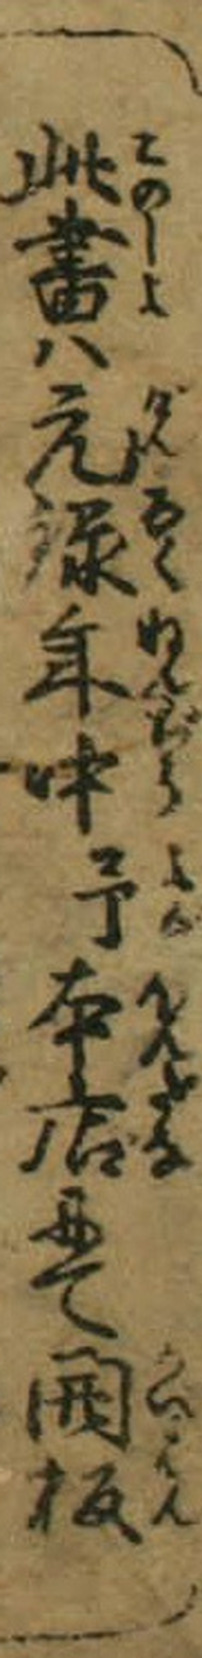此書は元禄年中予本店にて開版
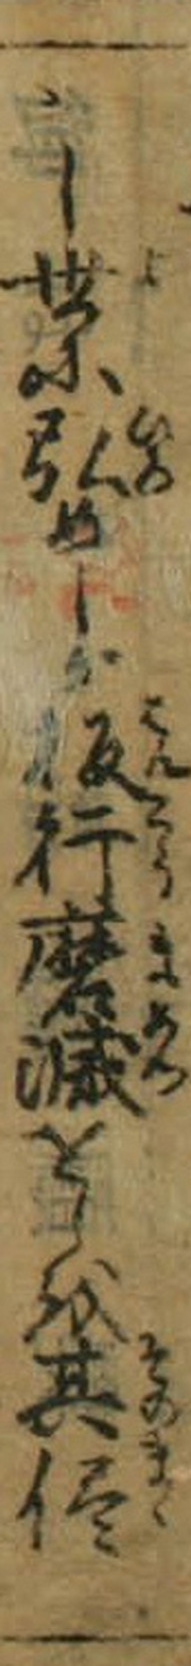し世に弘めしが板行磨滅をし紙其儘
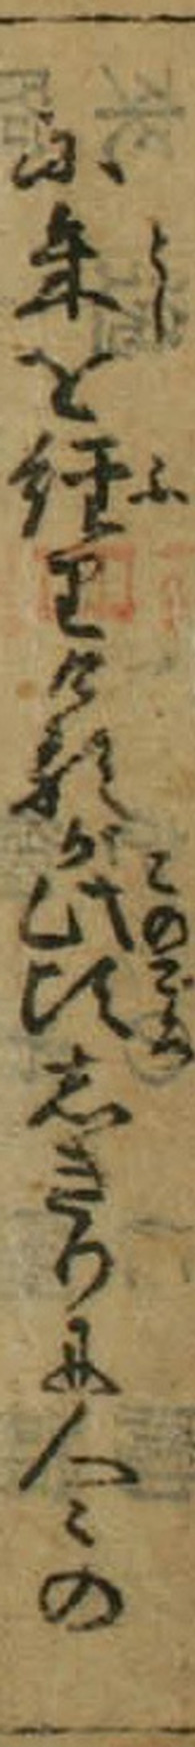に年を経りけるが此頃しきりに人々の
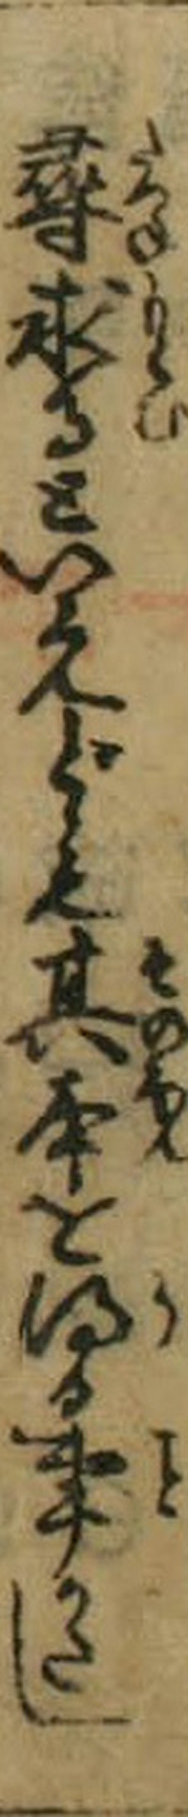尋求るといえども其本を得る事かたし
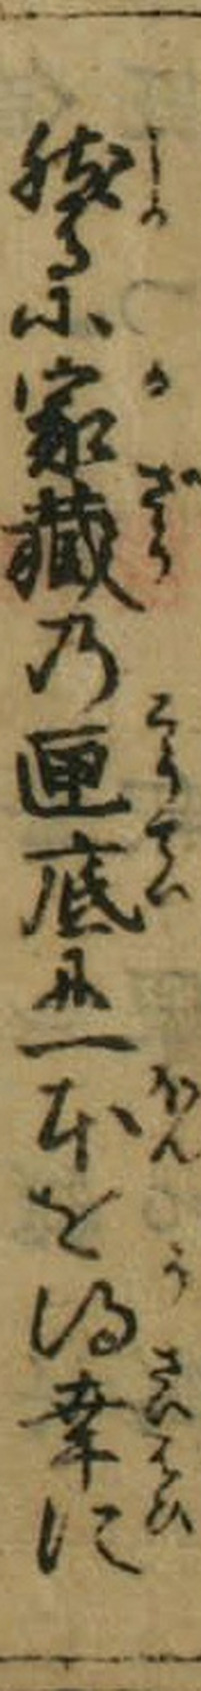然るに家蔵の匣底に一本を得幸に
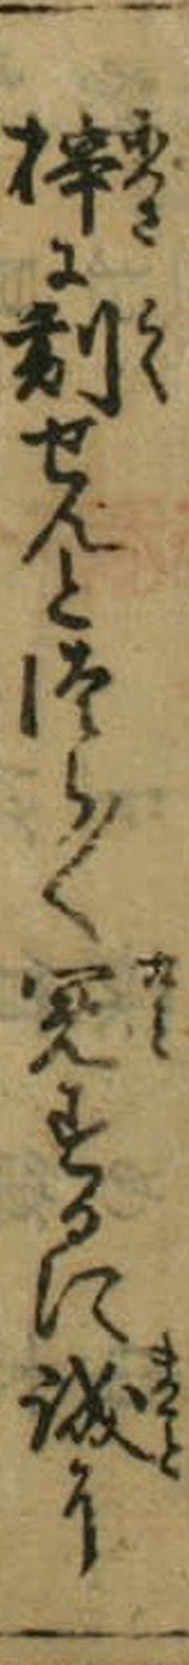梓に刻せんとつら〳〵するに誠に
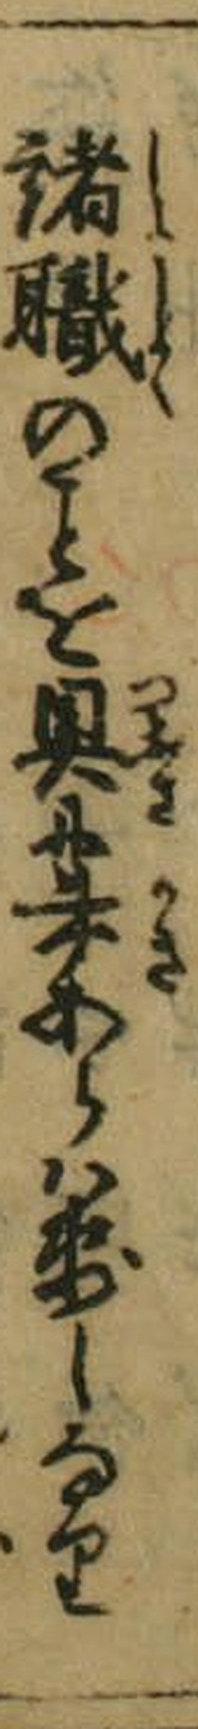諸職のことを具に書あらはしなり
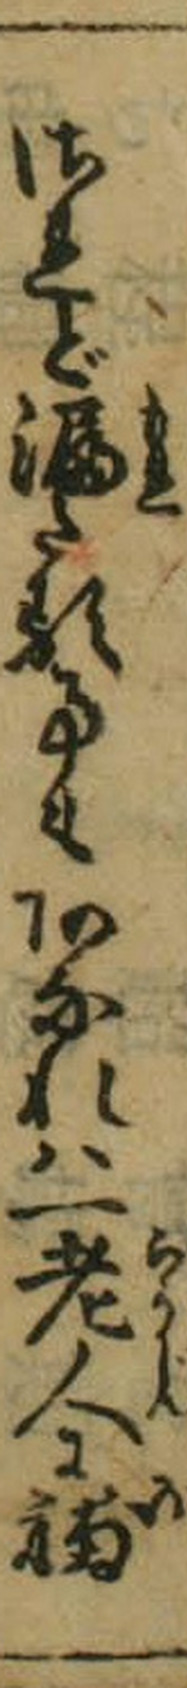されど漏たる事もあるれは一老人に補
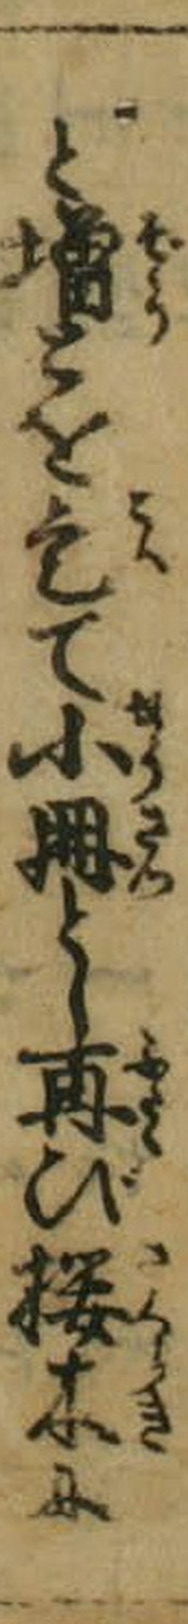と増とを乞て小冊とし再び桜木に
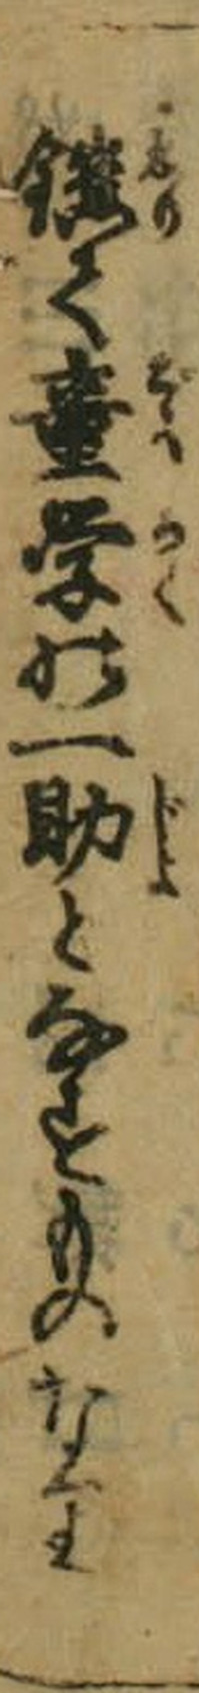鐫て童学の一助となすものなり
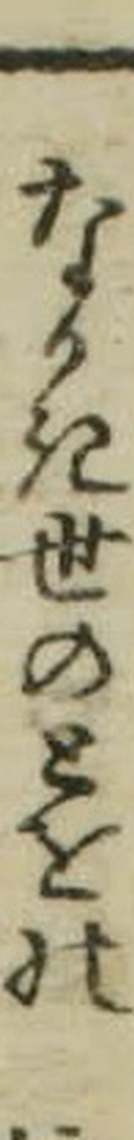なかき世のとをの
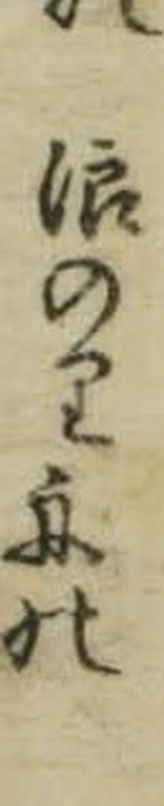浪のり舟の
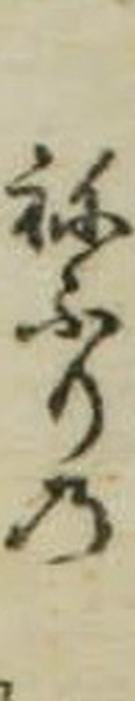ねふりの
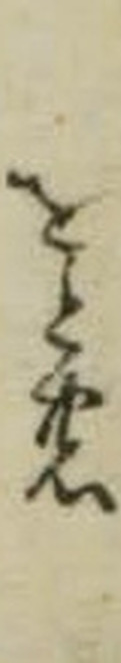をとの
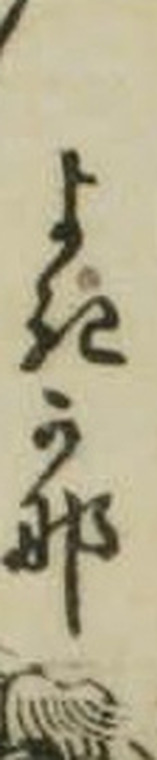よきかな
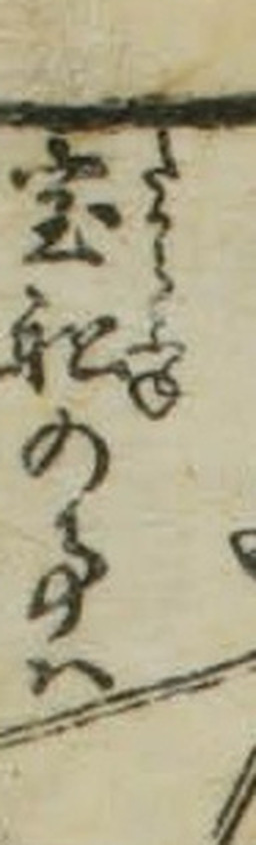宝船の事は
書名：増補職人往来
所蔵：東京学芸大学教育コンテンツアーカイブ
